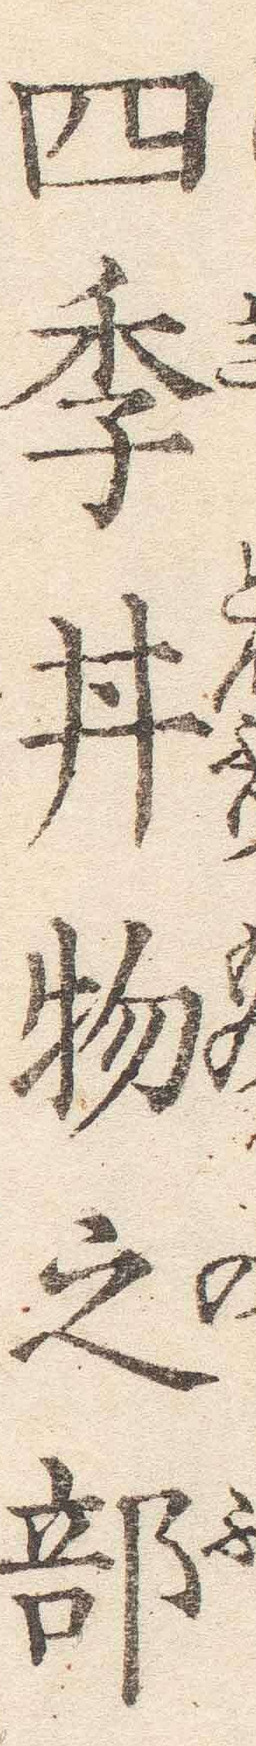四季丼物之部
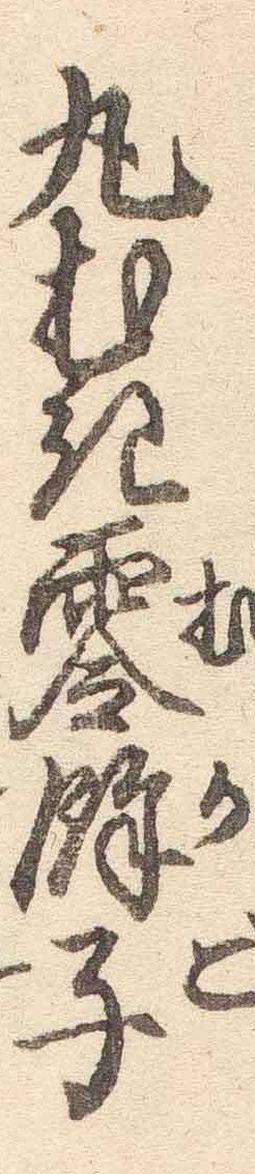丸むき零余子
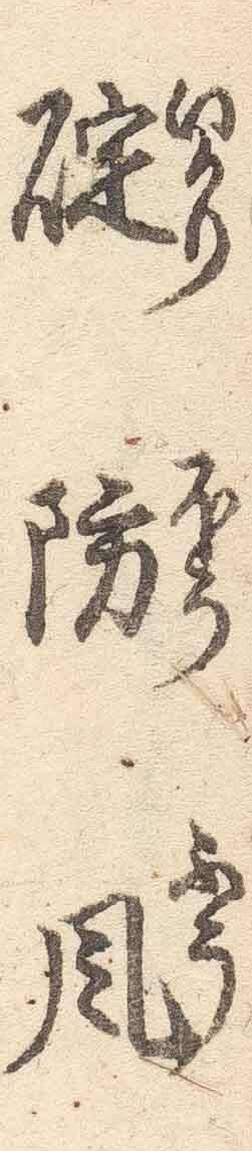碇防風
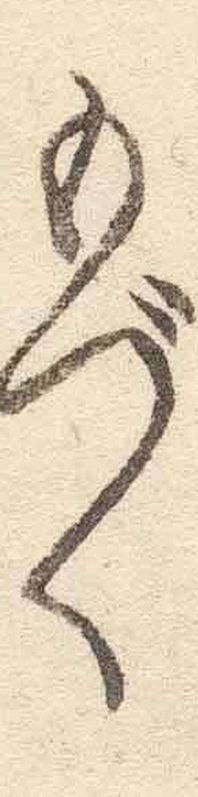もづく
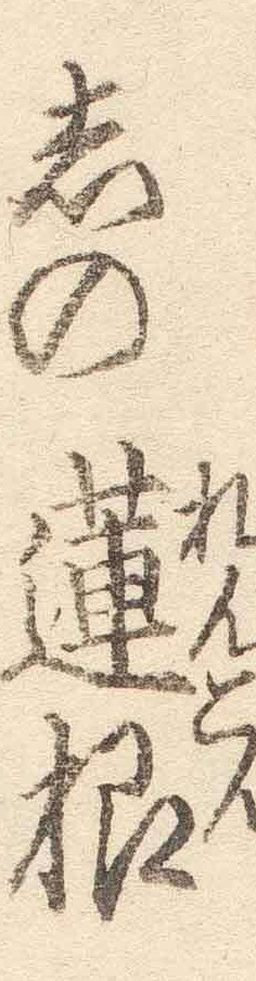しの蓮根
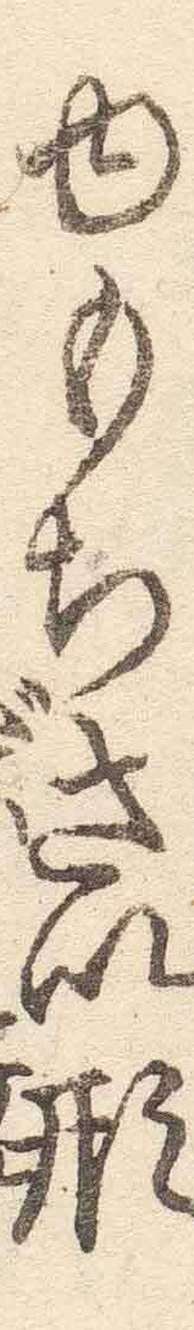ゆもちさい形
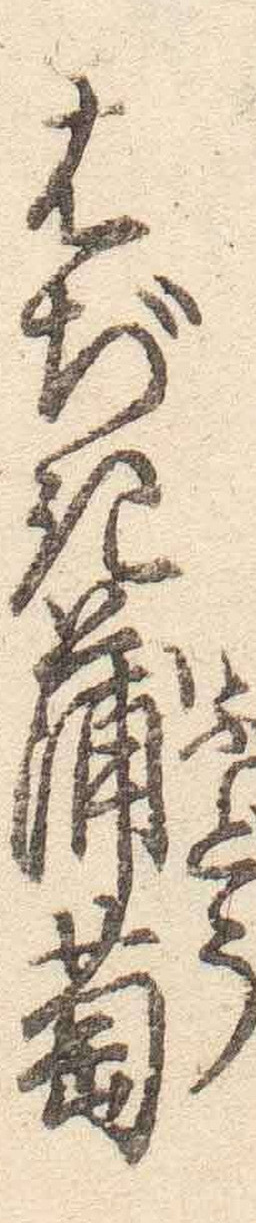はぢき葡萄
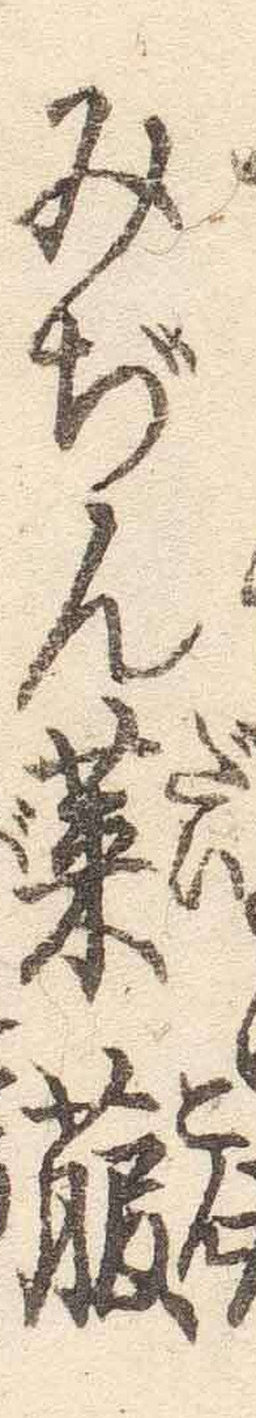みぢん菜菔
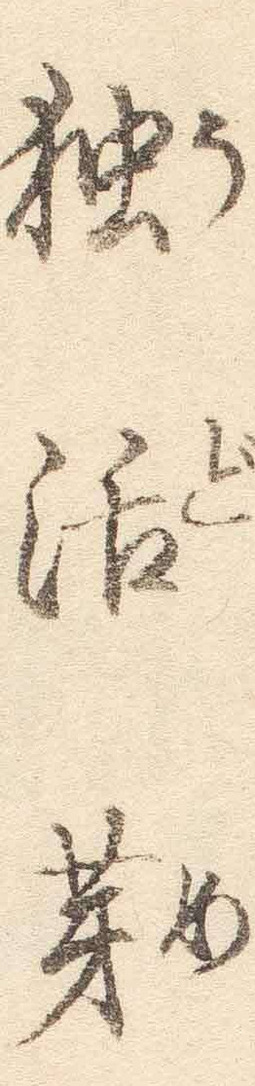独活芽
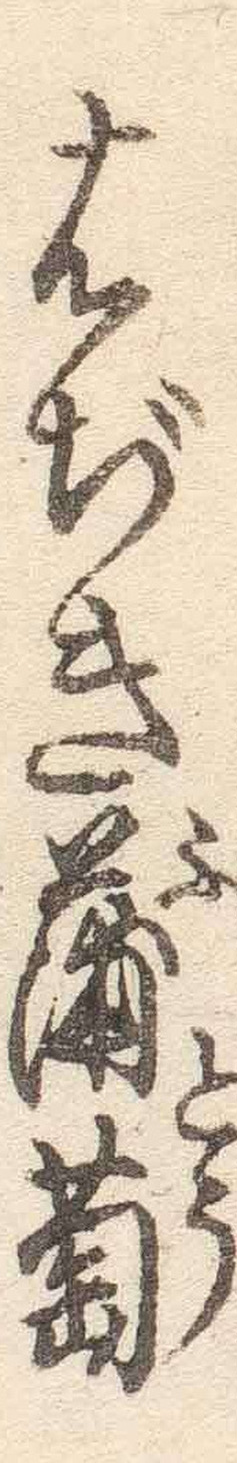はぢき葡萄
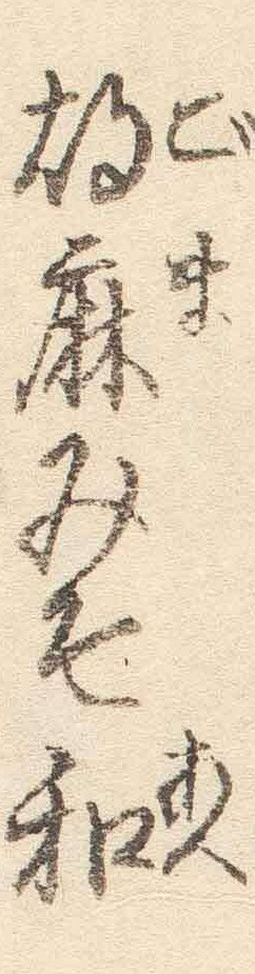胡麻みそ和
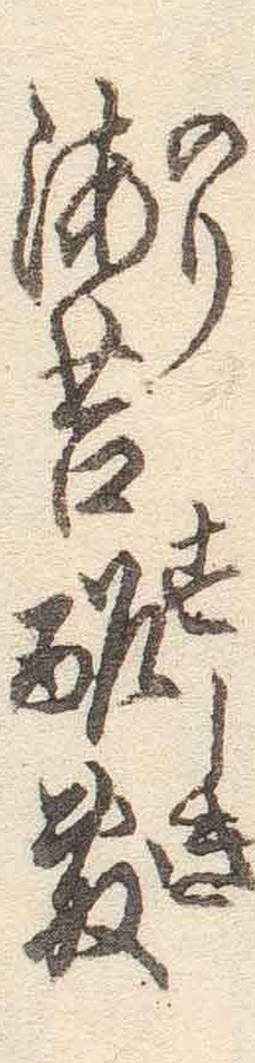海苔酢敷
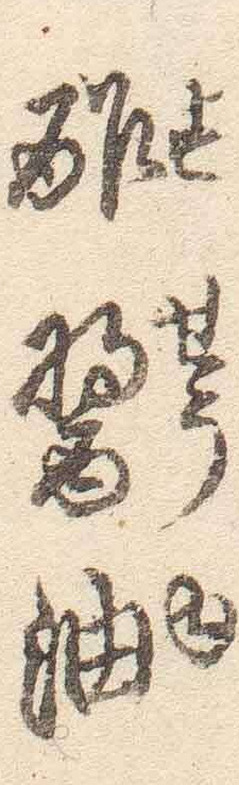酢醤油
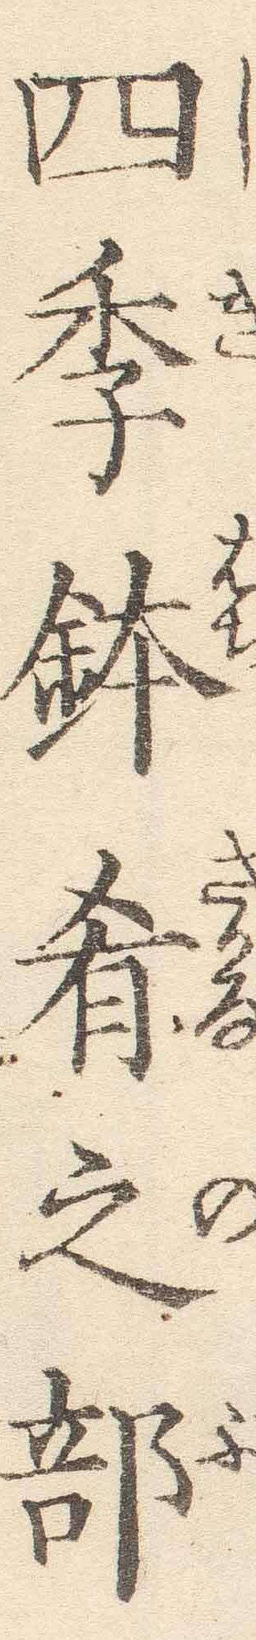四季鉢肴之部

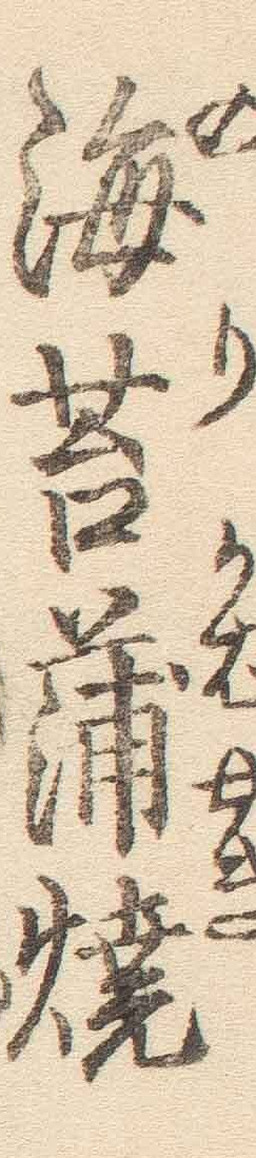海苔蒲焼
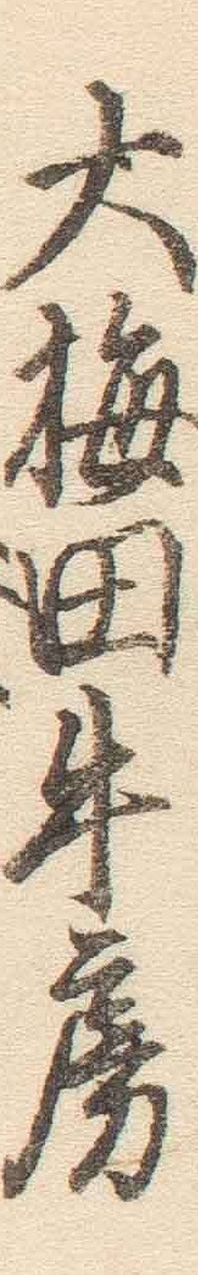大梅田牛蒡
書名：料理通
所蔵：東京学芸大学附属図書館 国文学研究資料館
